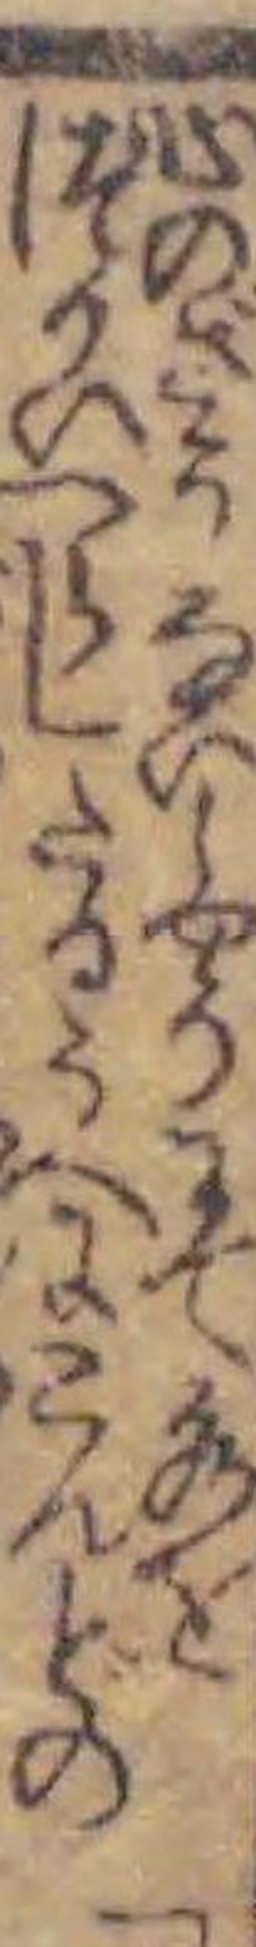つかいへらしたるうへにこんどの
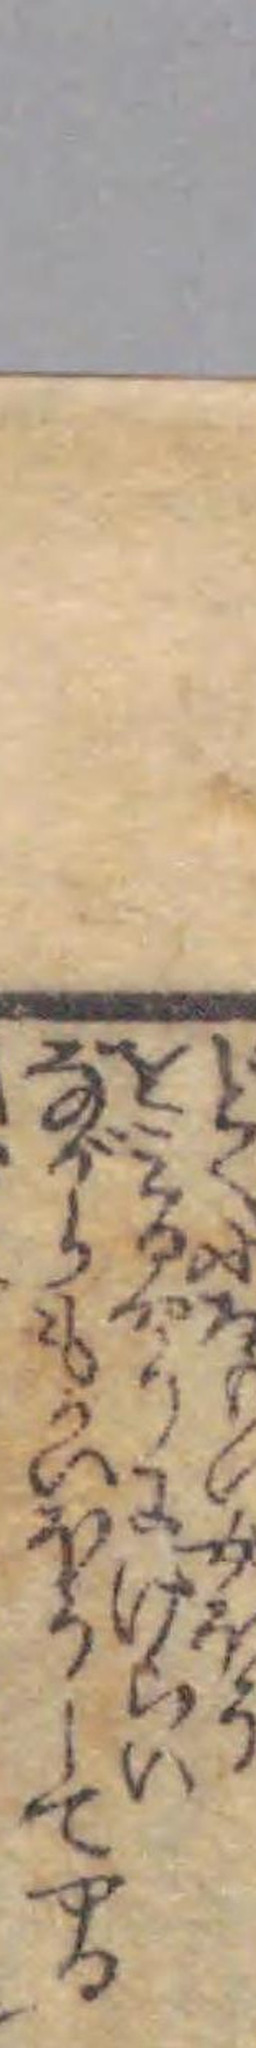ながらもかいほうしてやる
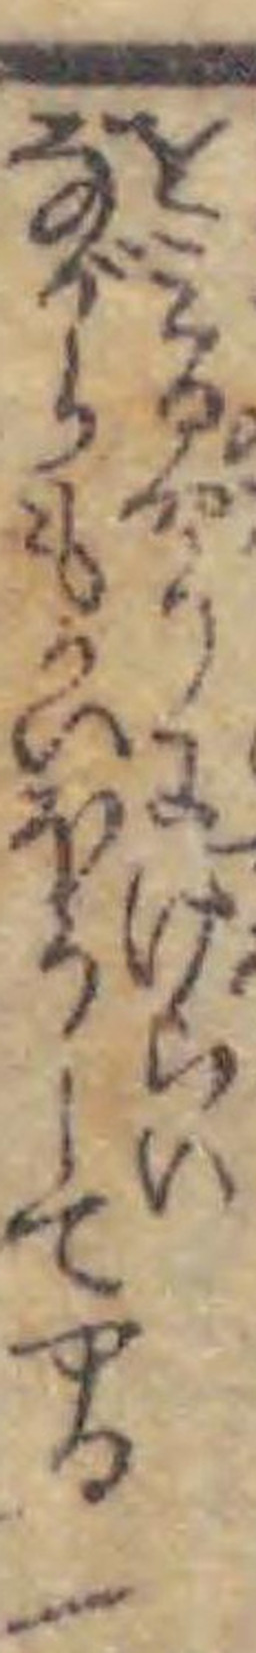ながらもかいほうしてやる
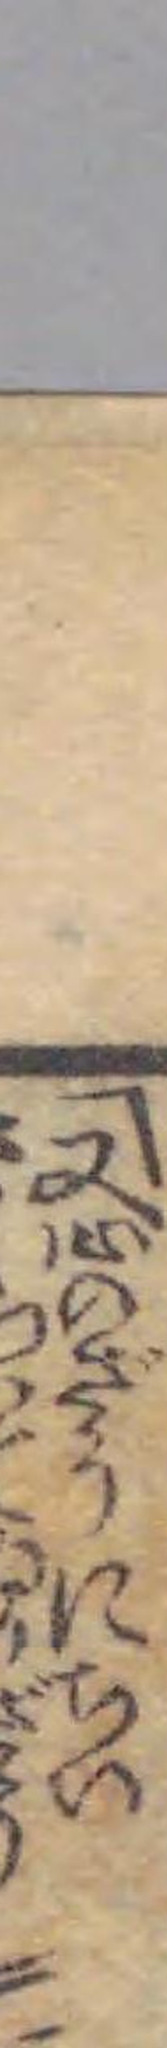〽又心のざうにちい
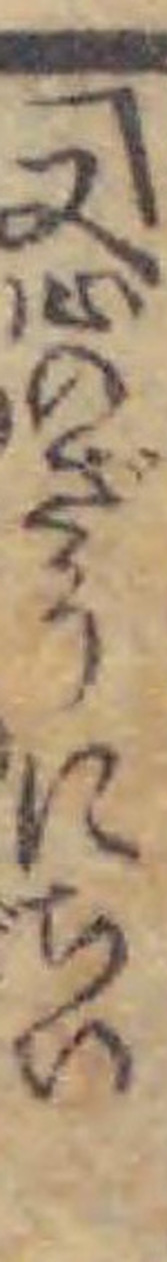〽又心のざうにちい
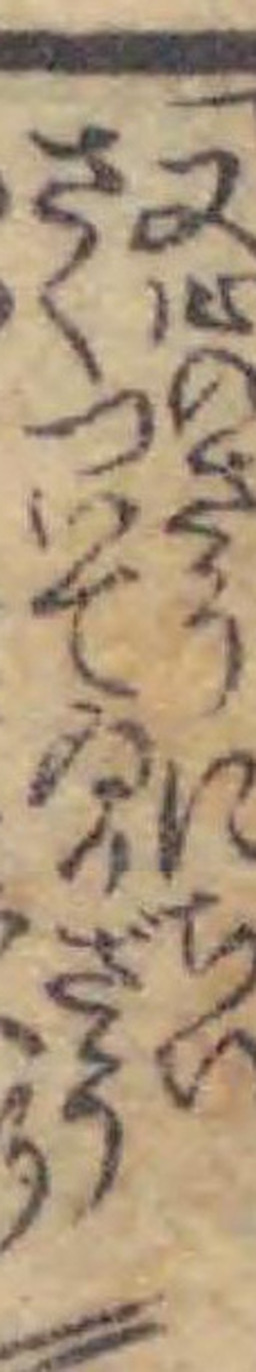さくついてゐかざう
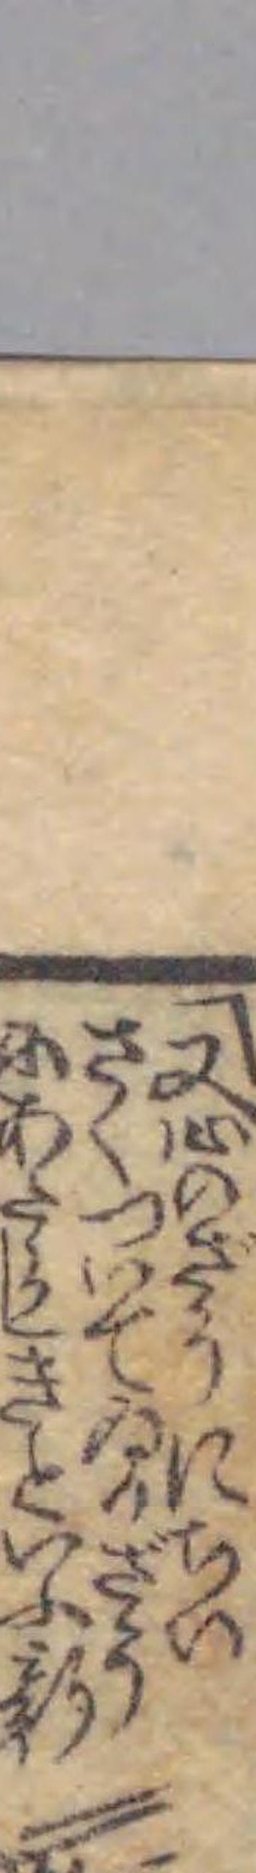さくついてゐかざう
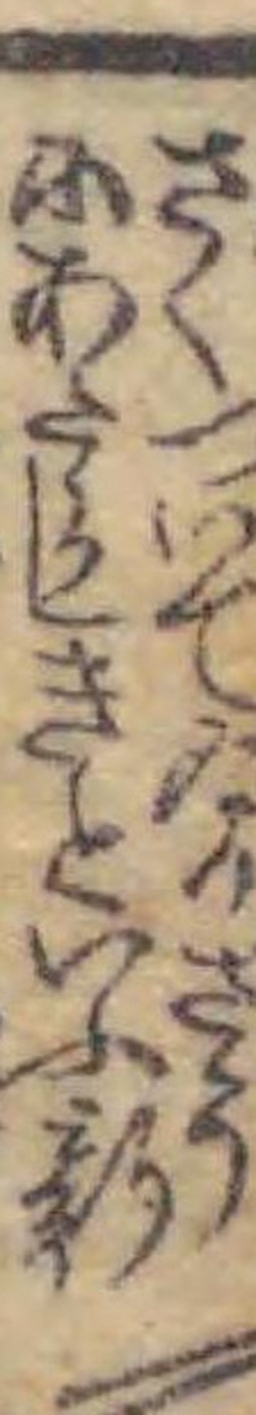にあたらしきといふ新
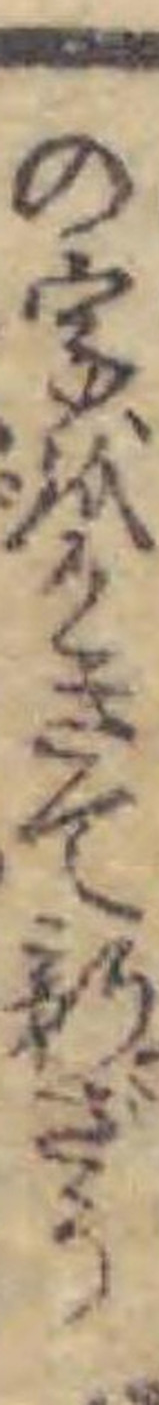の字をかきて新ざう
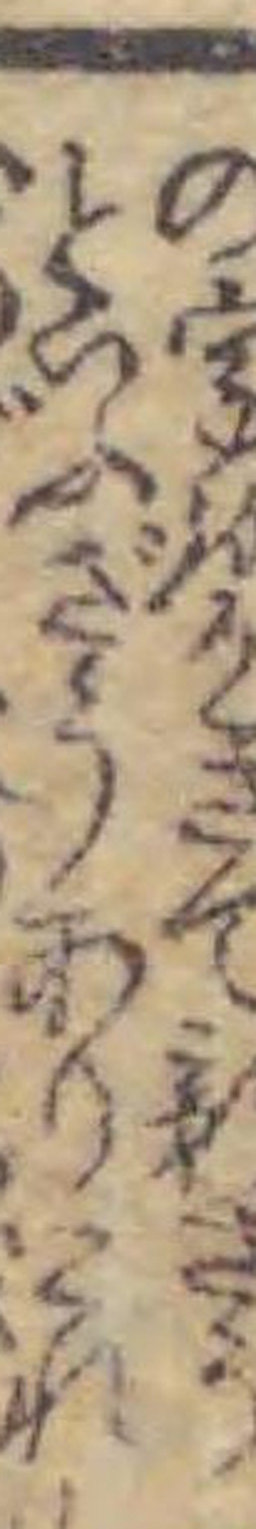といふざうありこれ
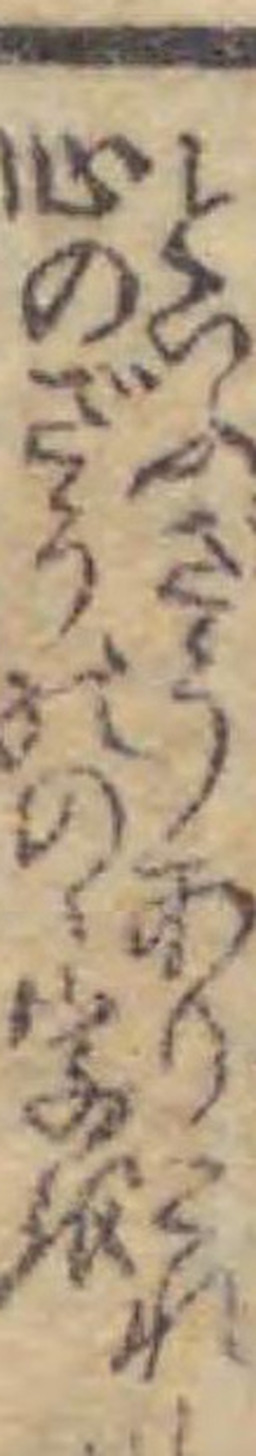心のざうののゝ字を
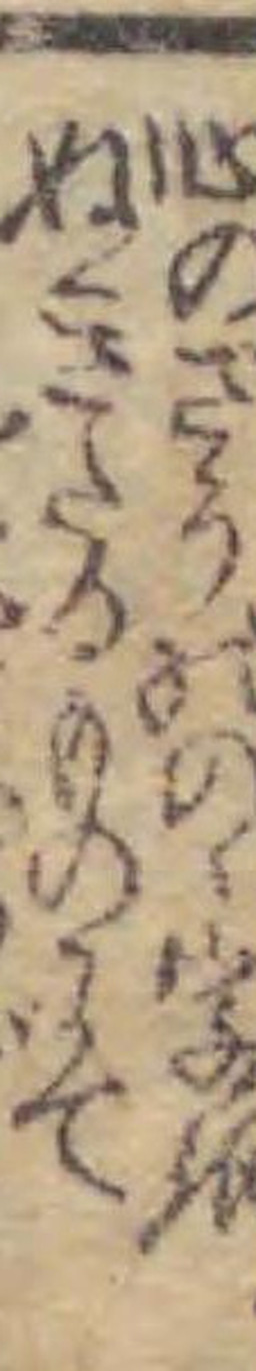ぬきたるものにて
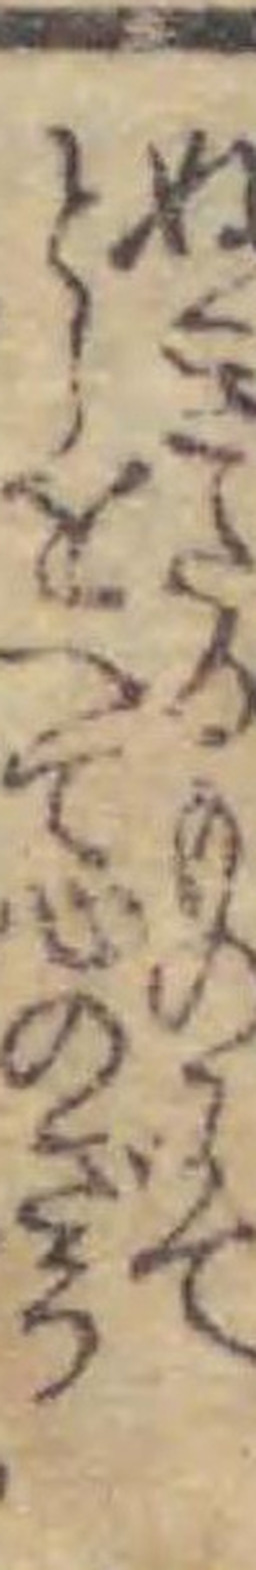としをへて心のざう
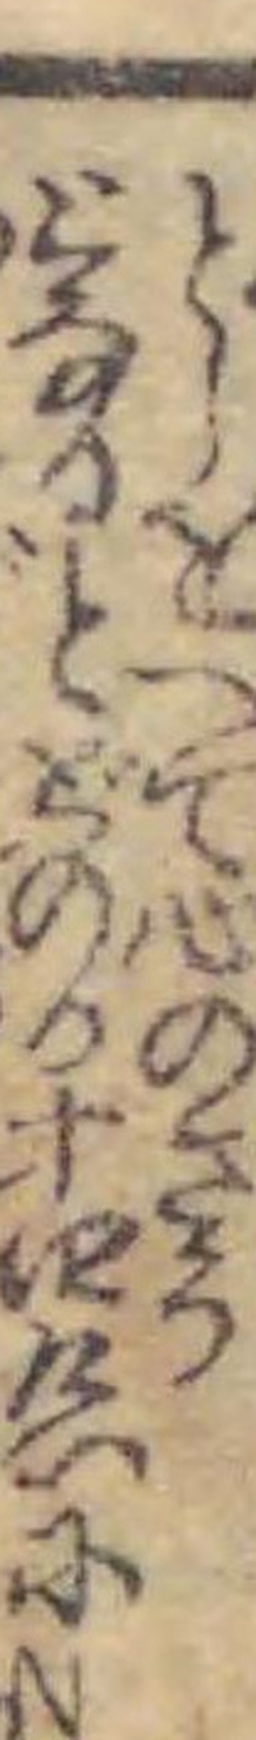となるとどのか十四けいに
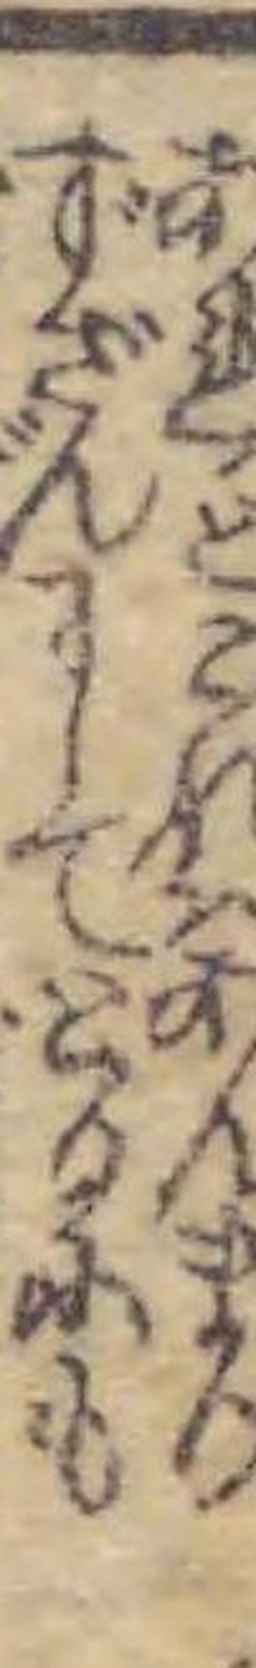ずざんにしてとるにも
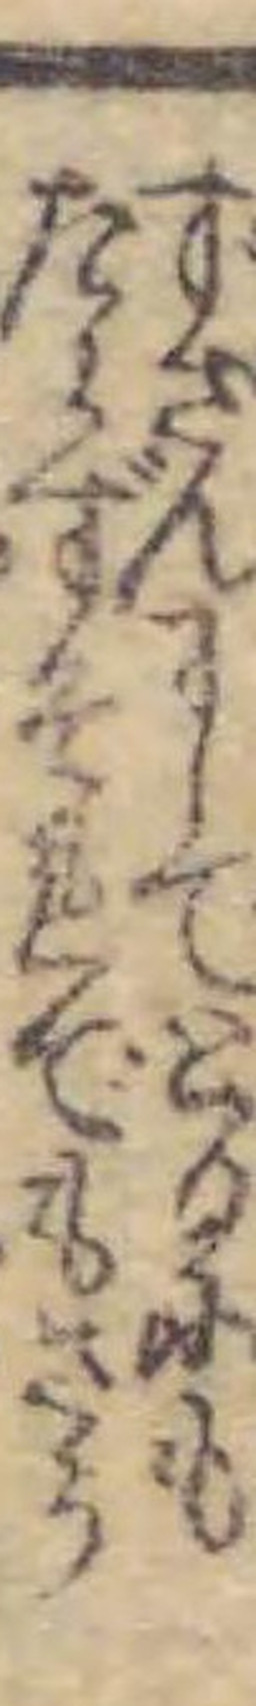たらずそれでもさう
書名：十四傾城腹之内 : 3巻
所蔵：国立国会図書館 National Diet Library, JAPAN
